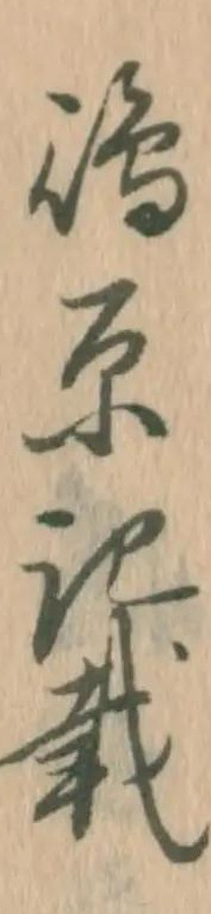島原記載
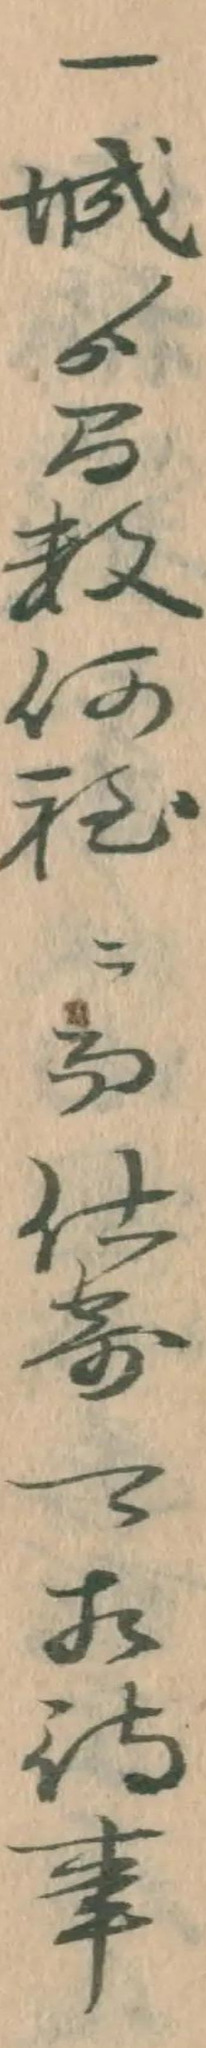一城ゟ間数何程に而仕寄可相待事
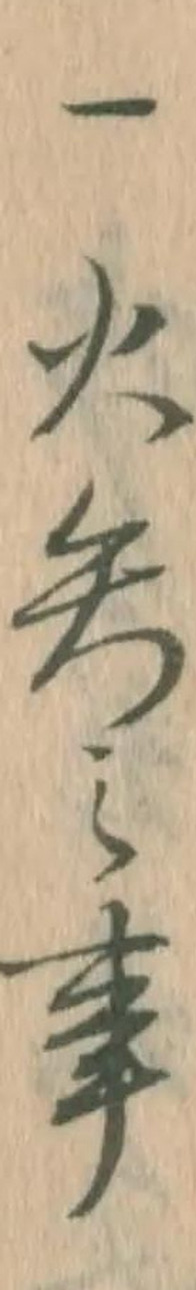一火矢之事
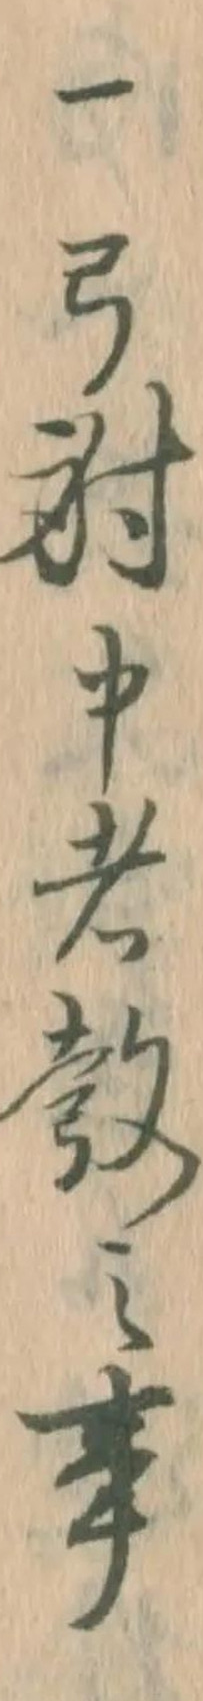一弓射申者教之事
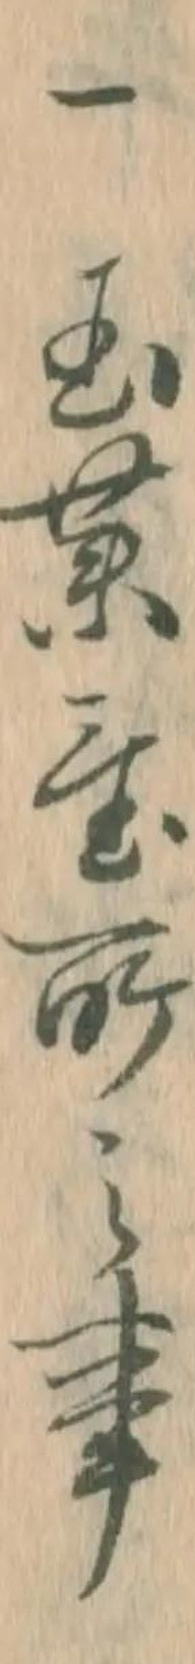一玉薬置所之事
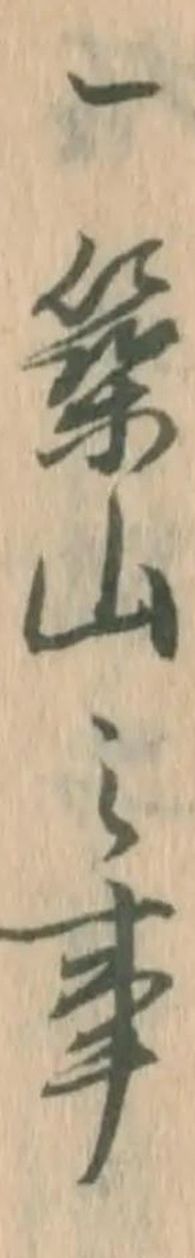一築山之事

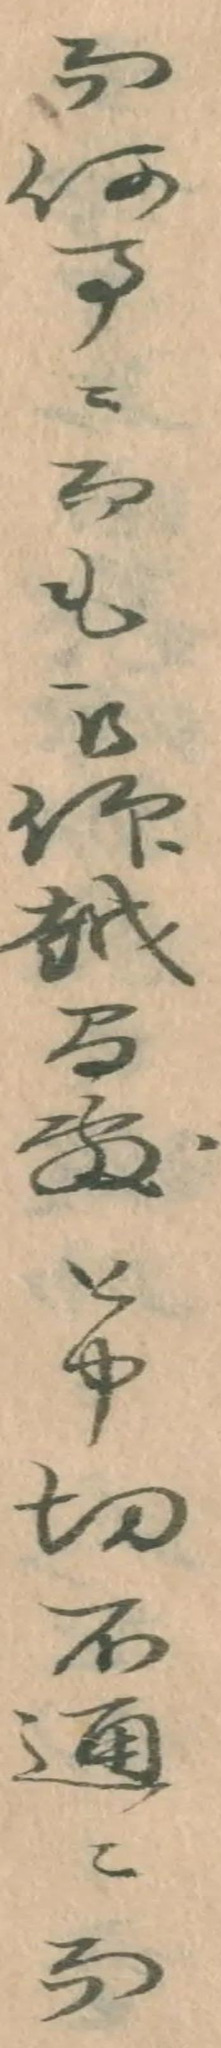而何事に而も被仰越間敷被申切不通に而
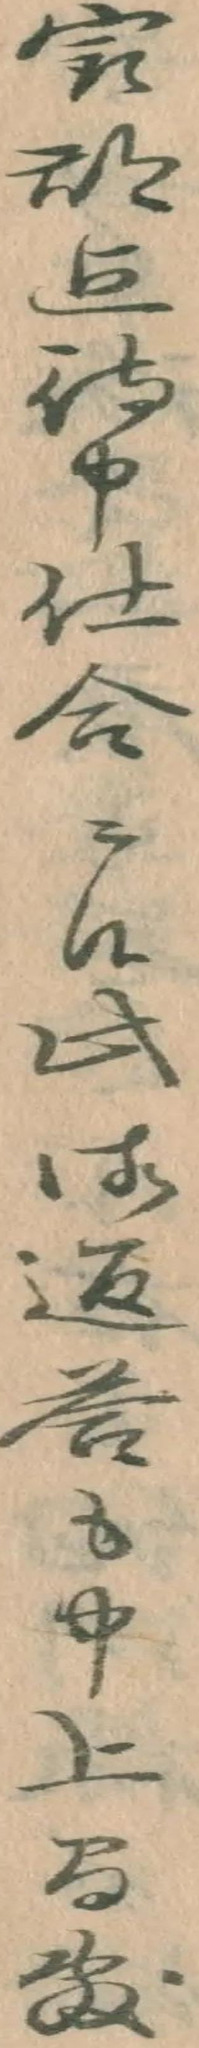最部迄待申仕合に候此御返答も申上間敷
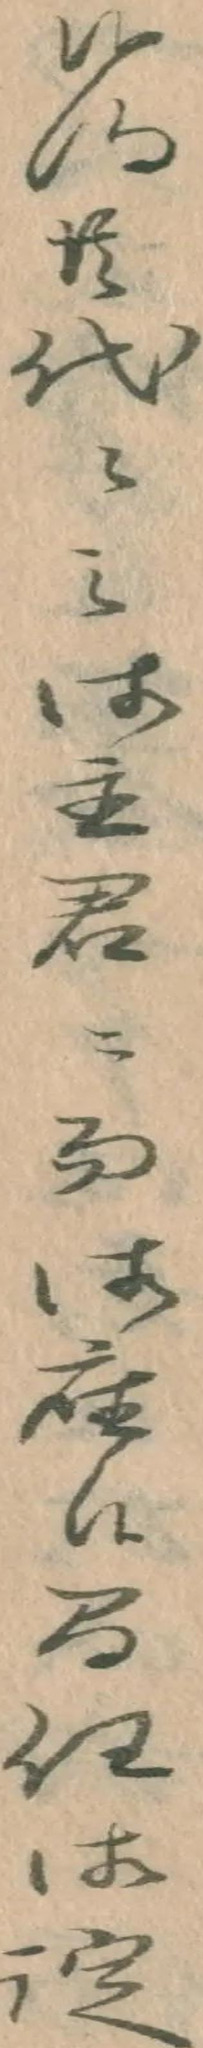候得共代々之御主君に而御座候間任御諚
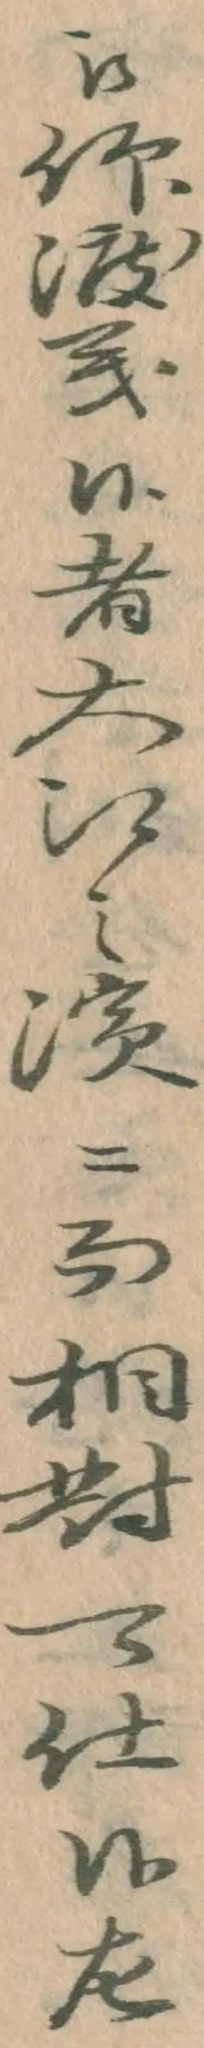被仰渡義候者大江之浜に而相対可仕候左
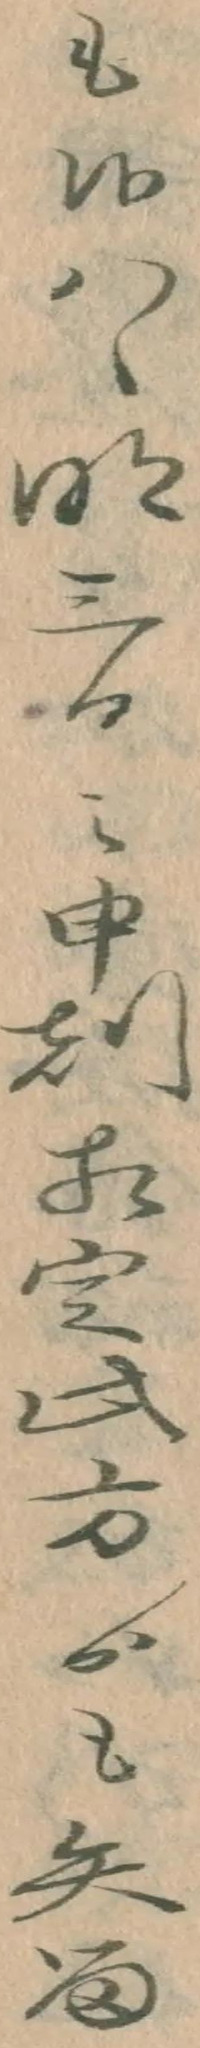も候はゝ明三日之申刻相定此方ゟも矢留
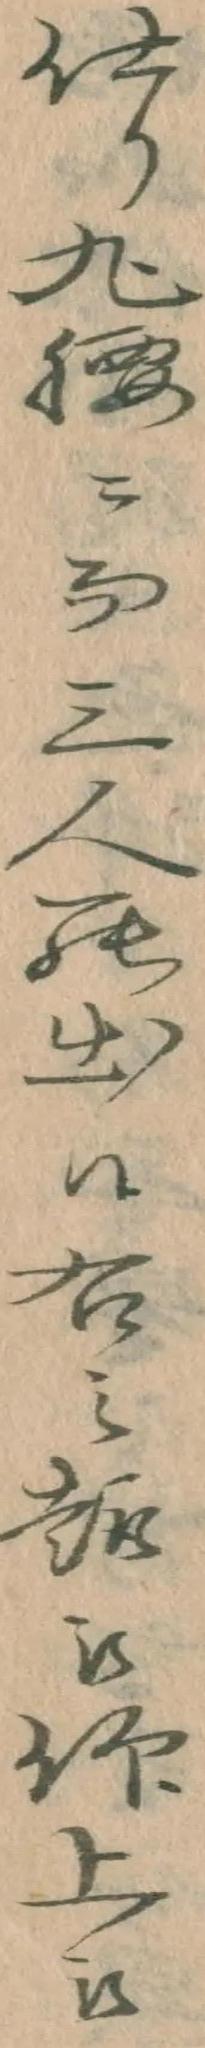仕り丸腰に而三人罷出候右之趣被仰上被
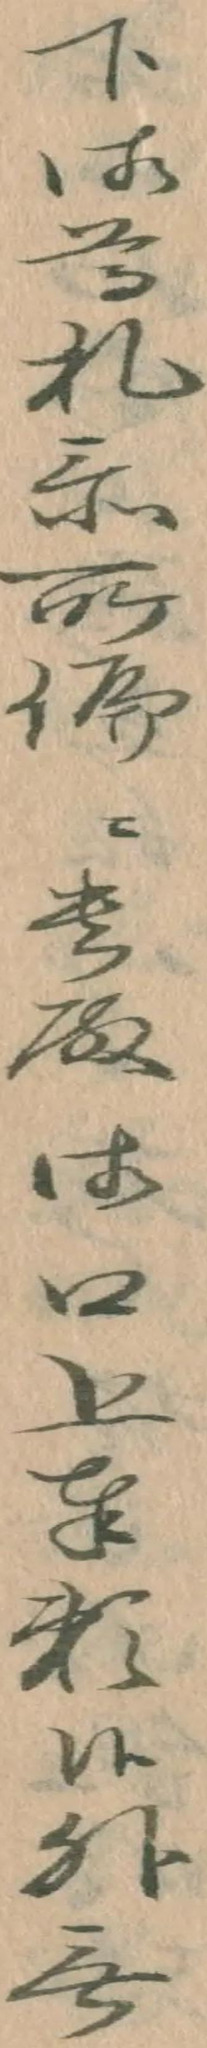下御尊札悉所偏に貴殿御口上奉頼候外無
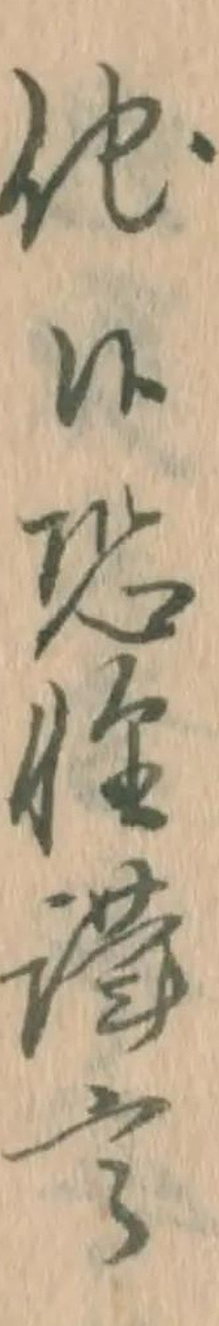他候恐惶謹言
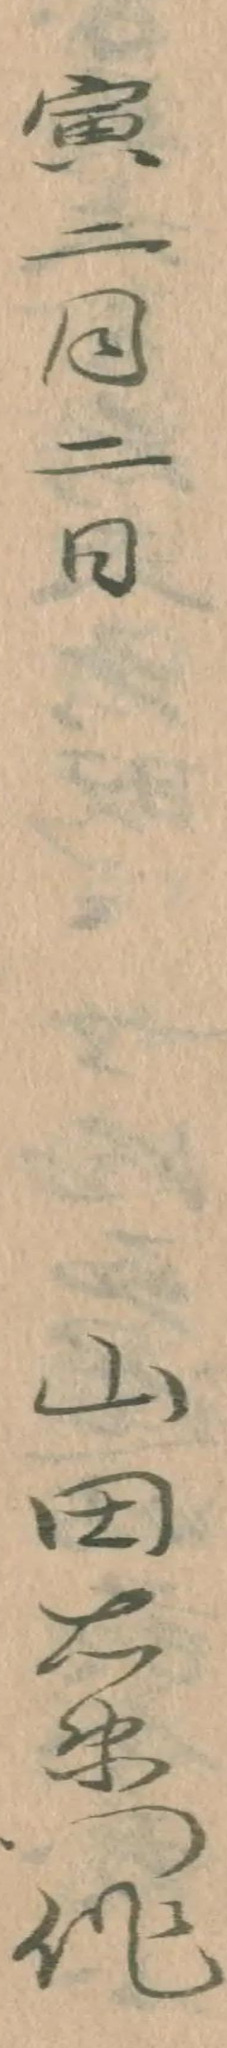寅二月二日山田右衛門作
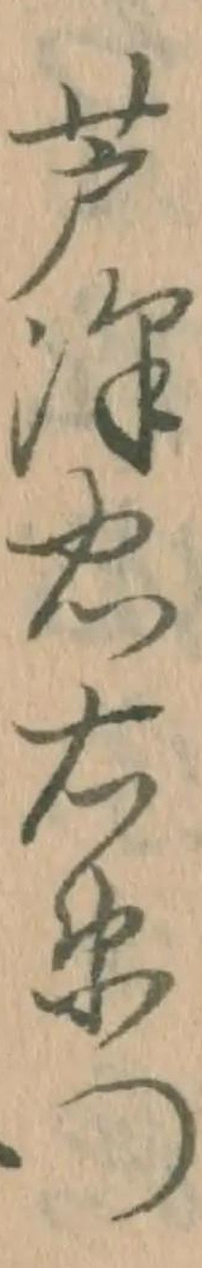芦沢忠右衛門
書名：切支丹御退治記 49巻. [6]
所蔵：国立国会図書館 National Diet Library, JAPAN
